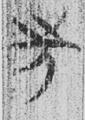先
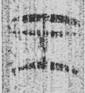王
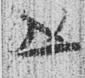之
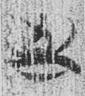至
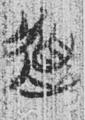道
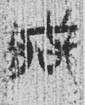戕（莊）
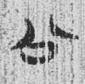公
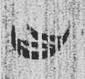曰
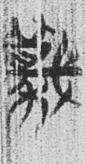○（沫）
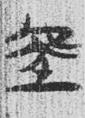○（吾）
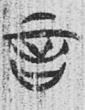言
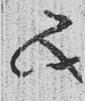氏（是）
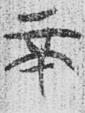不（否）
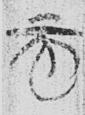而
